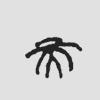而
